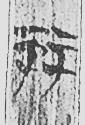幵
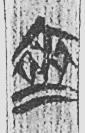齊
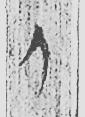人
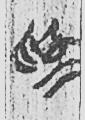爲
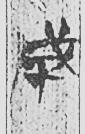成
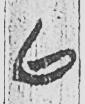㠯（以）
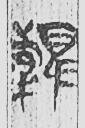{倝鳥}
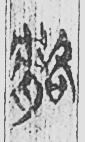骼
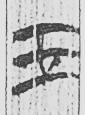玉
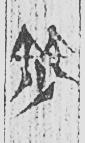{竹少}
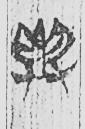與
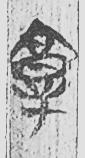{亯羊}
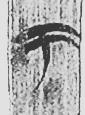于
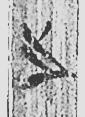之
